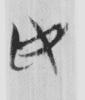女
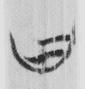曰
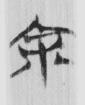余
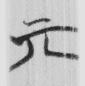亓
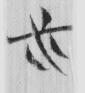必
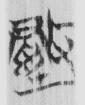{冃爪目土攴}
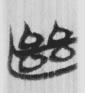㡭
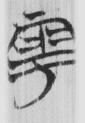𩁹
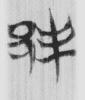邦
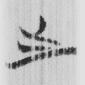之
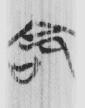命
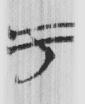于
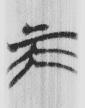天
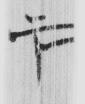下
